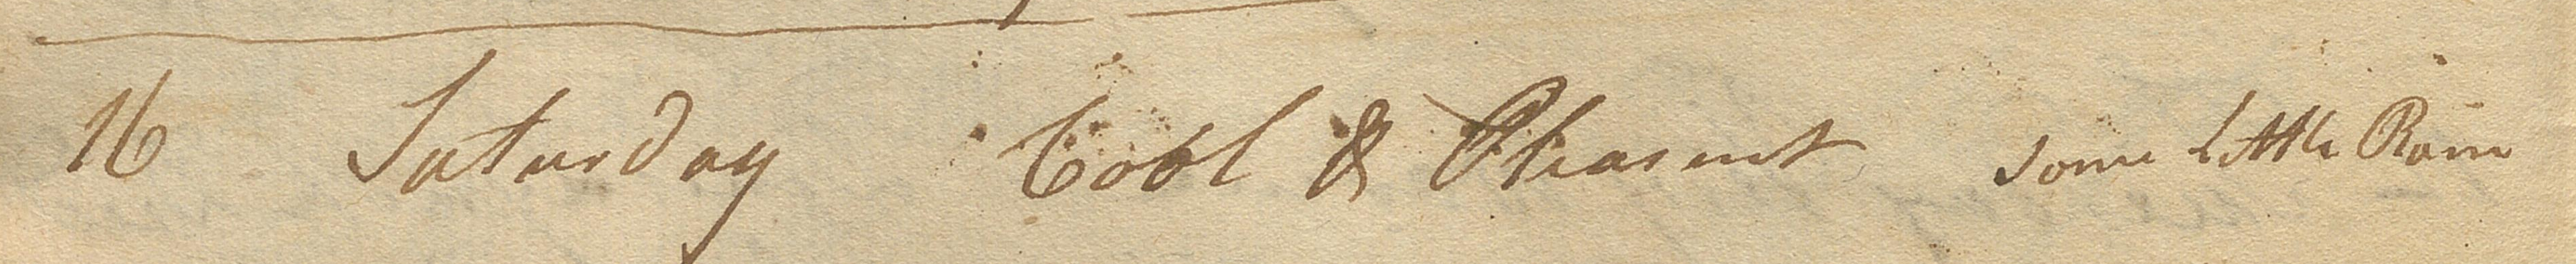16 Saturday Cobl & Pleasent some Little Rain
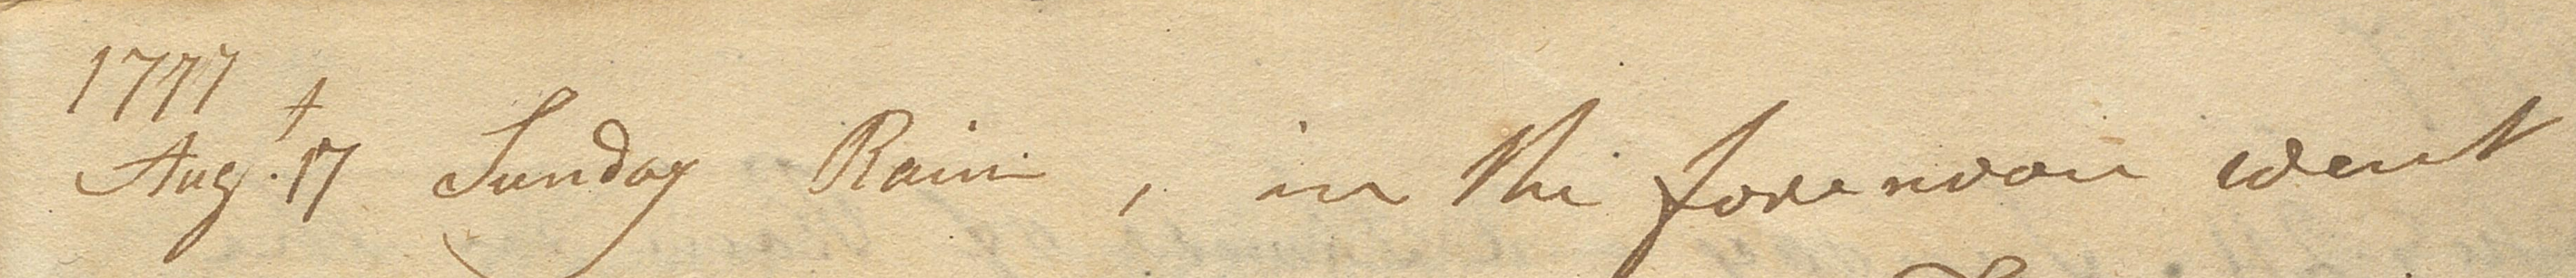Aug^t. 17 Sunday Rain, in the forenoon went
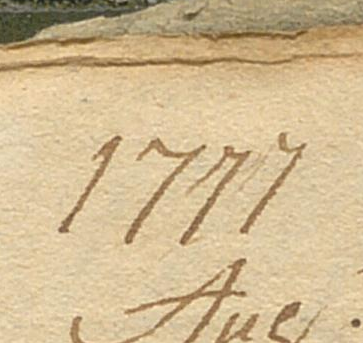1777
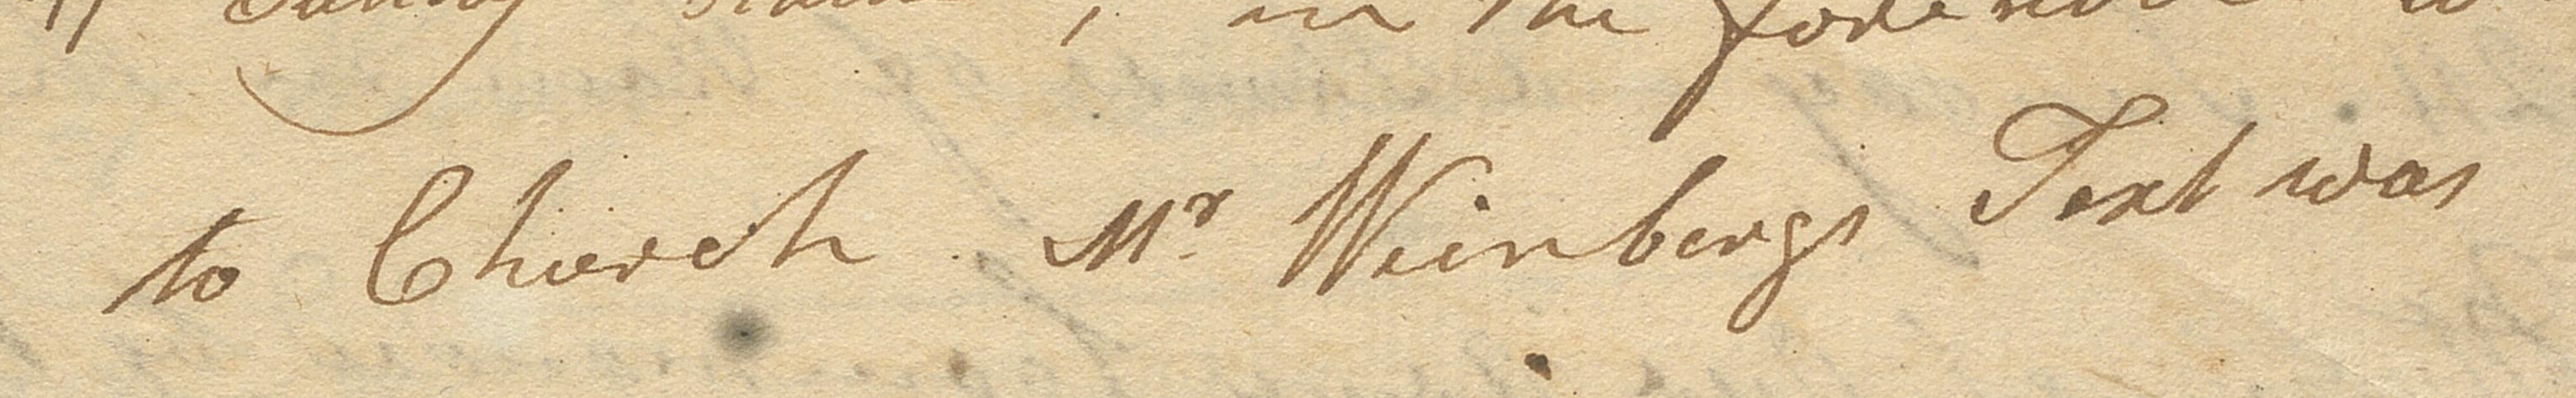to Church M^r. Weinbergs Text was
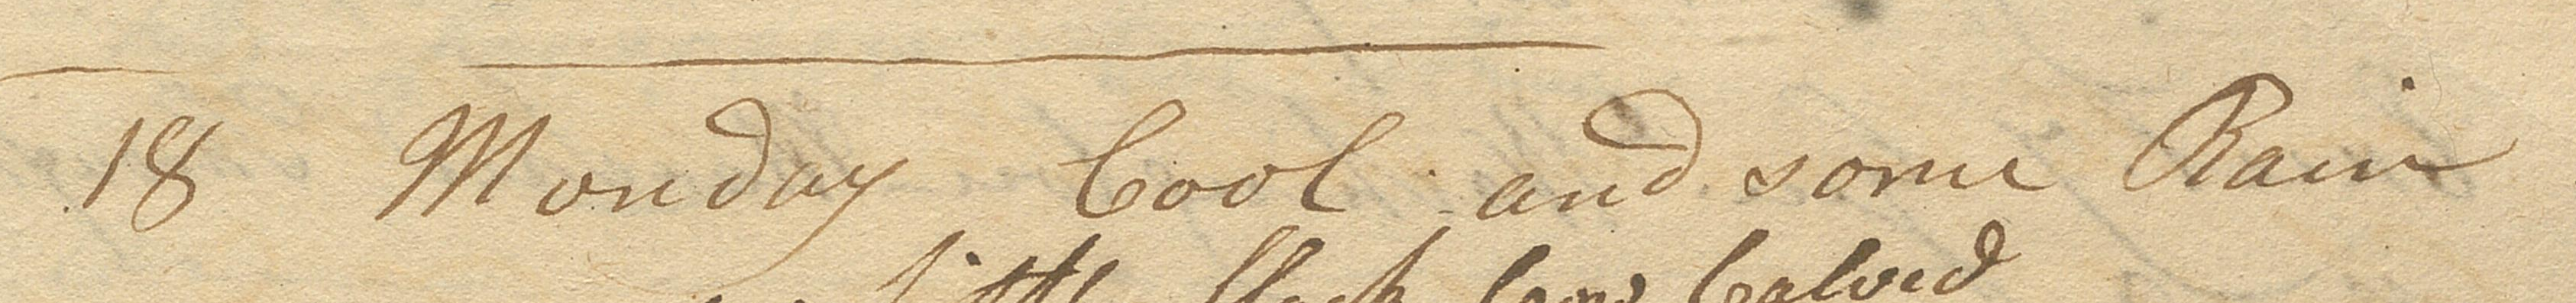18 Monday Cool and some Rain
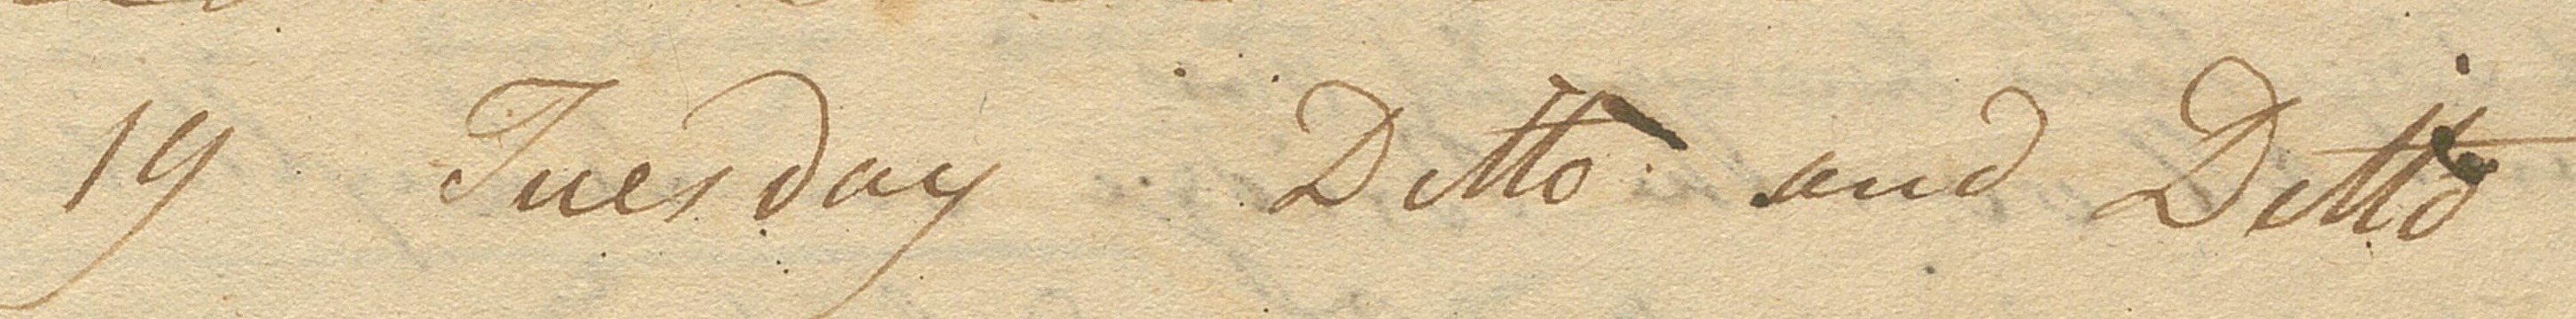19 Tuesday. Ditto and Ditto
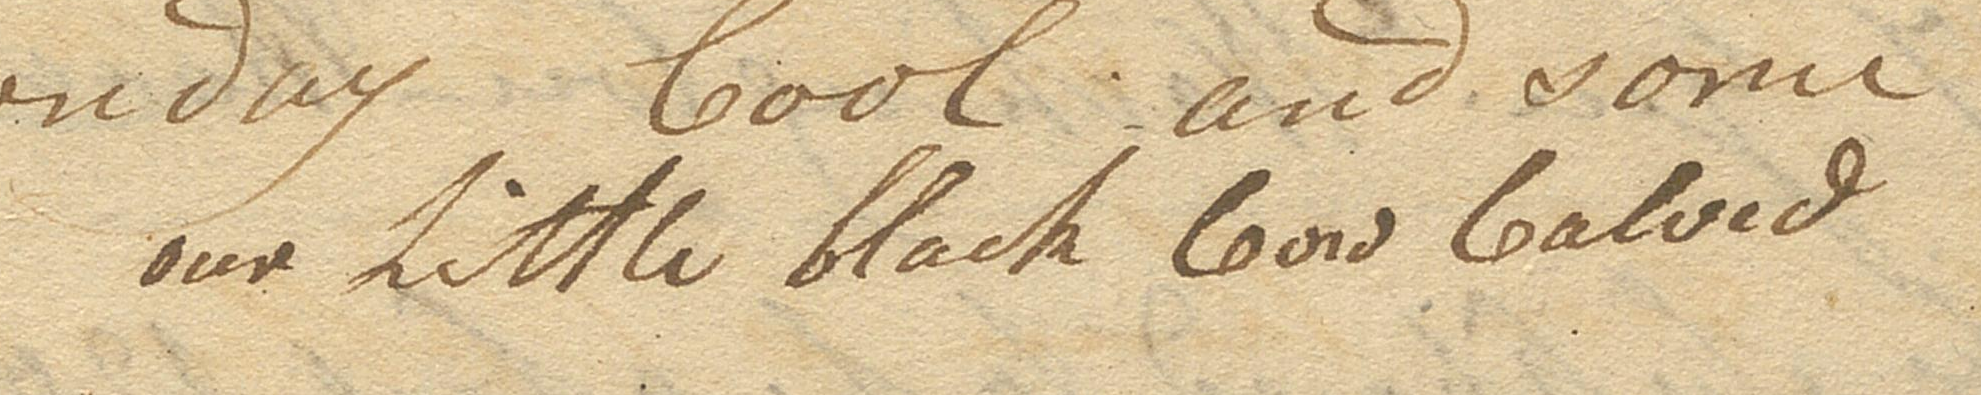our Little black Cow Calved
